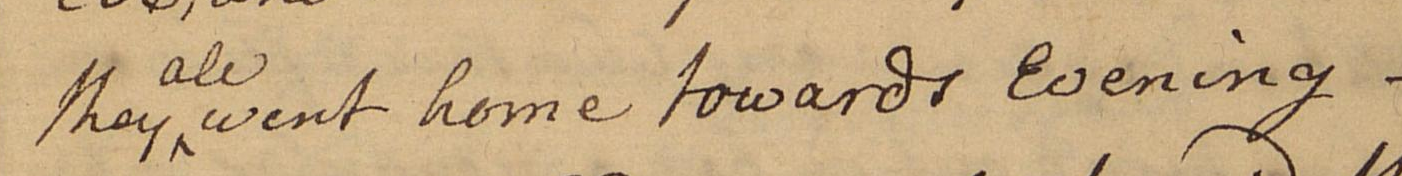they ^ went home towards Evening-
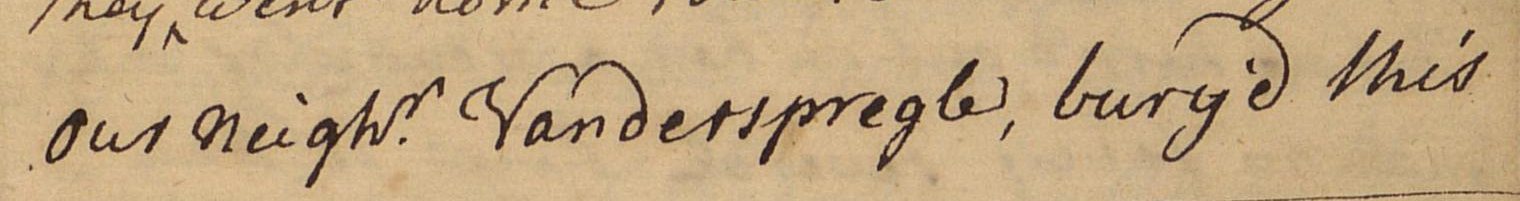our neigh^r. Vanderspregle, bury'd this
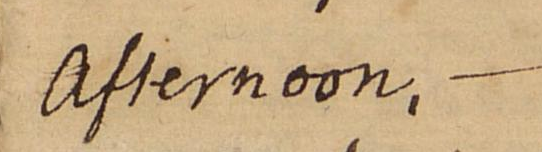Afternoon,-
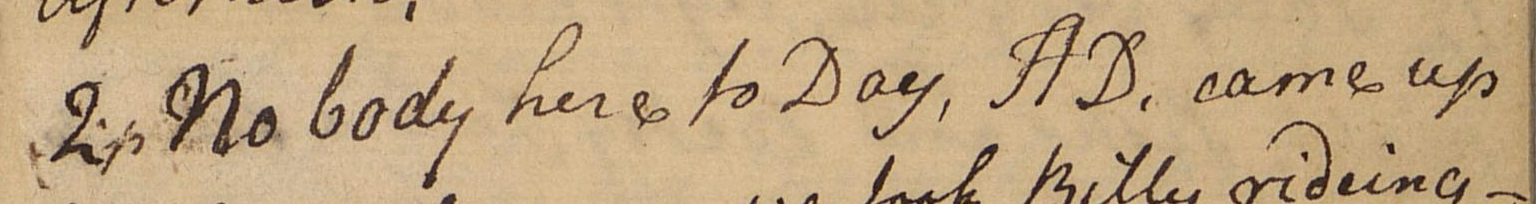2 No body here to Day, H D. came up
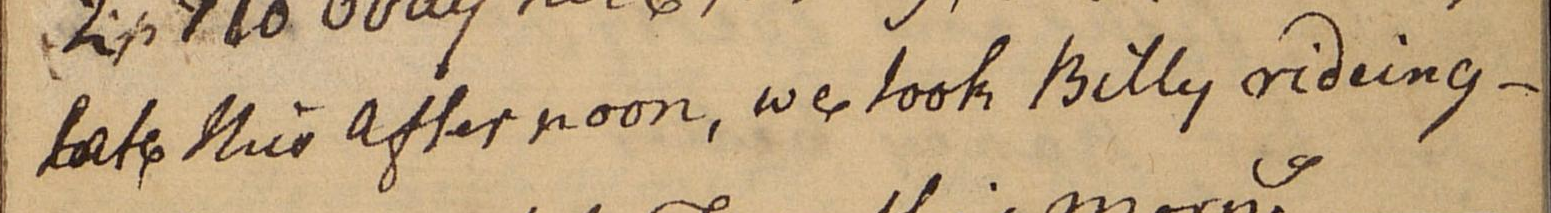late this afternoon, we took Billy rideing-
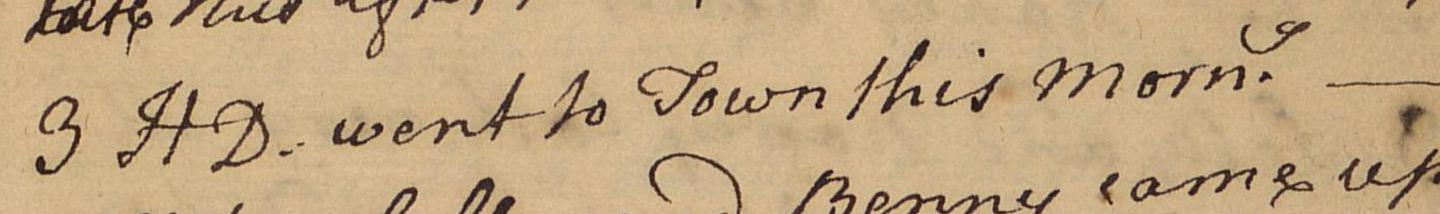3 HD. went to Town this morn^g.-
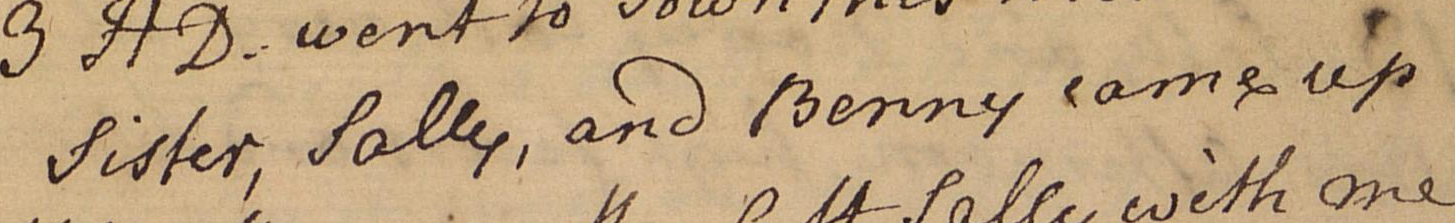Sister, Sally, and Benny came up
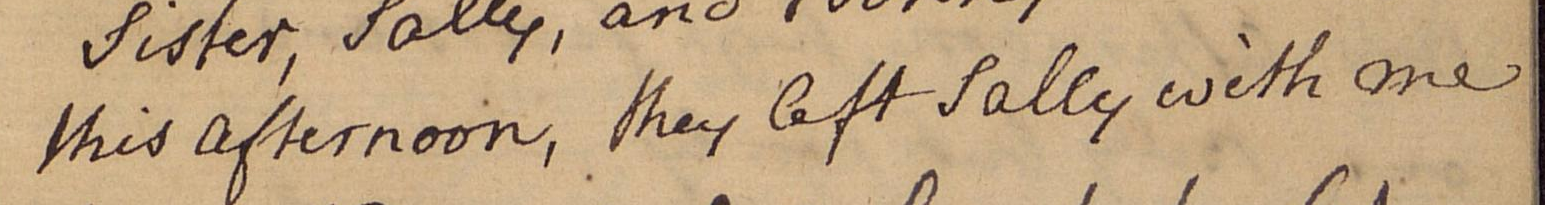this afternoon, they left Sally with me
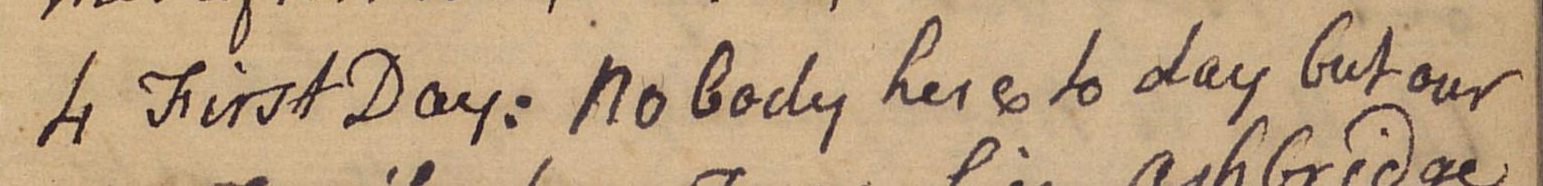4 First Day: No body here to day but our
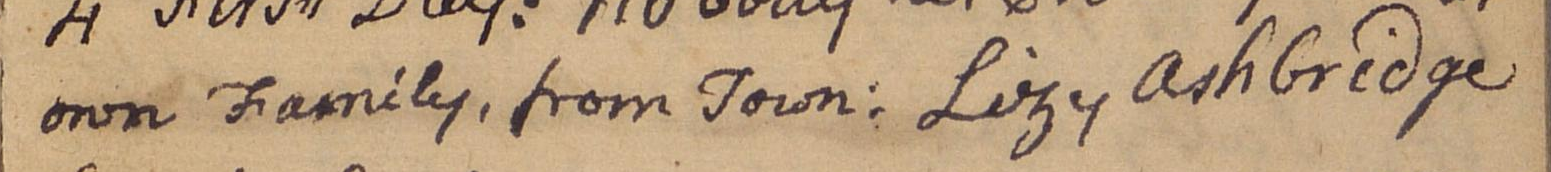own Family, from Town. Lizy Ashbridge
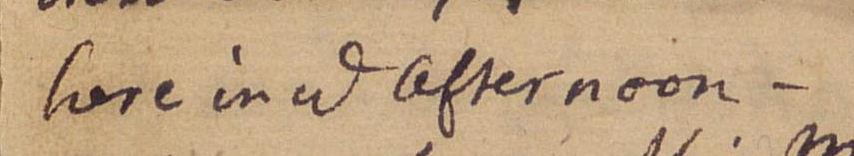here in y^e Afternoon-
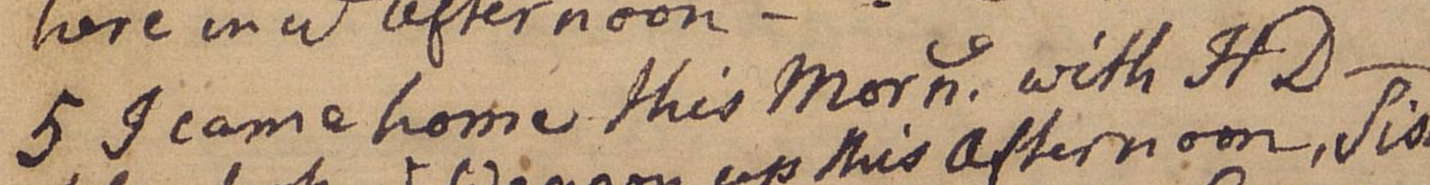5 I came home this morn^g with H D-
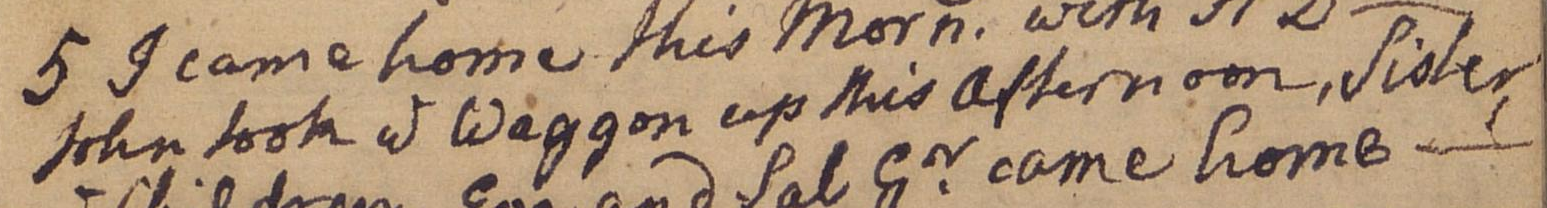John took y^e Waggon up this Afternoon, Sister
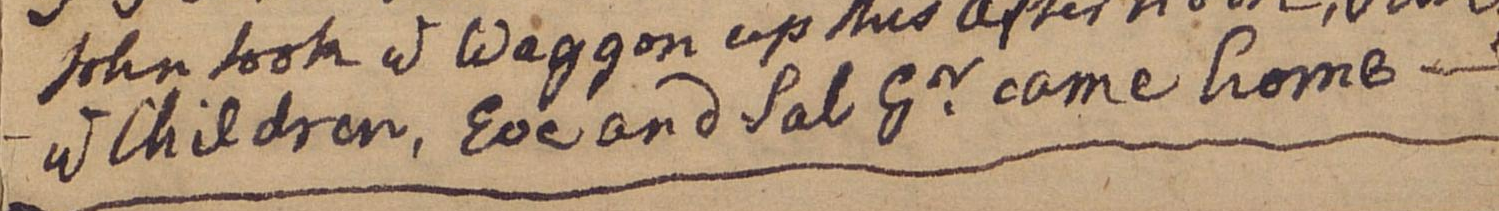y^e Children, Eve and Sal G^r. came home-
